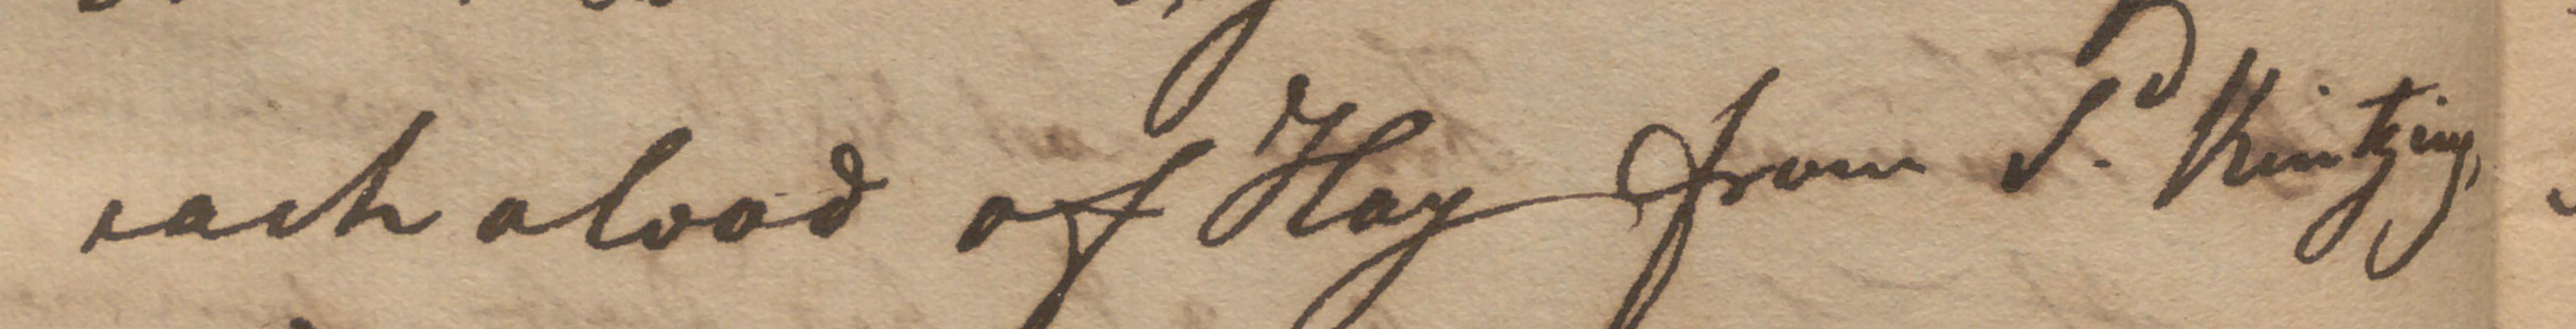each a load of Hay from S^d. Kintzing,
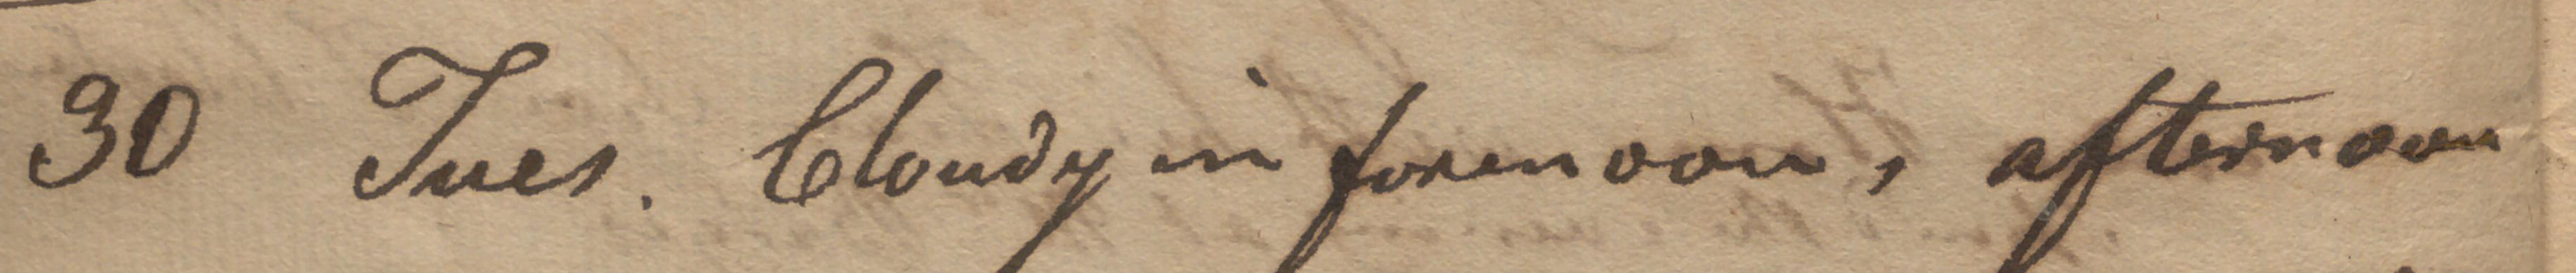30 Tues. Cloudy in forenoons afternoon
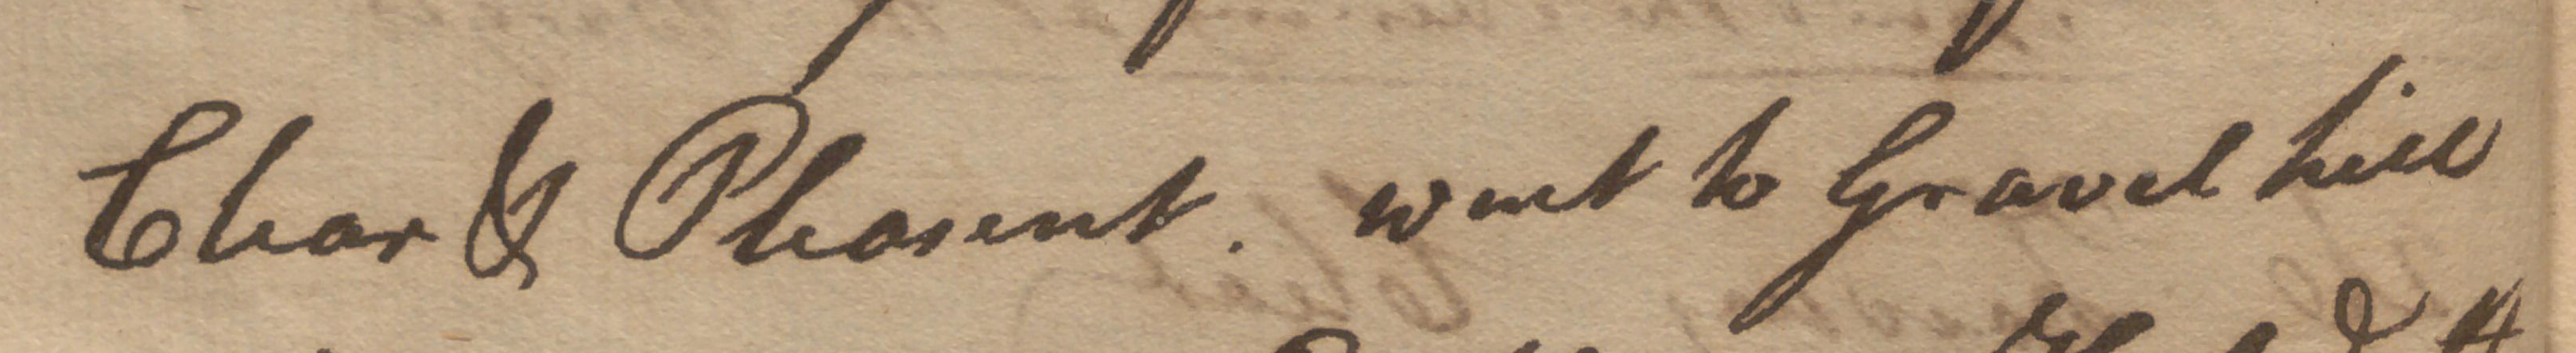Clear & Pleasent. went to Gravel hill
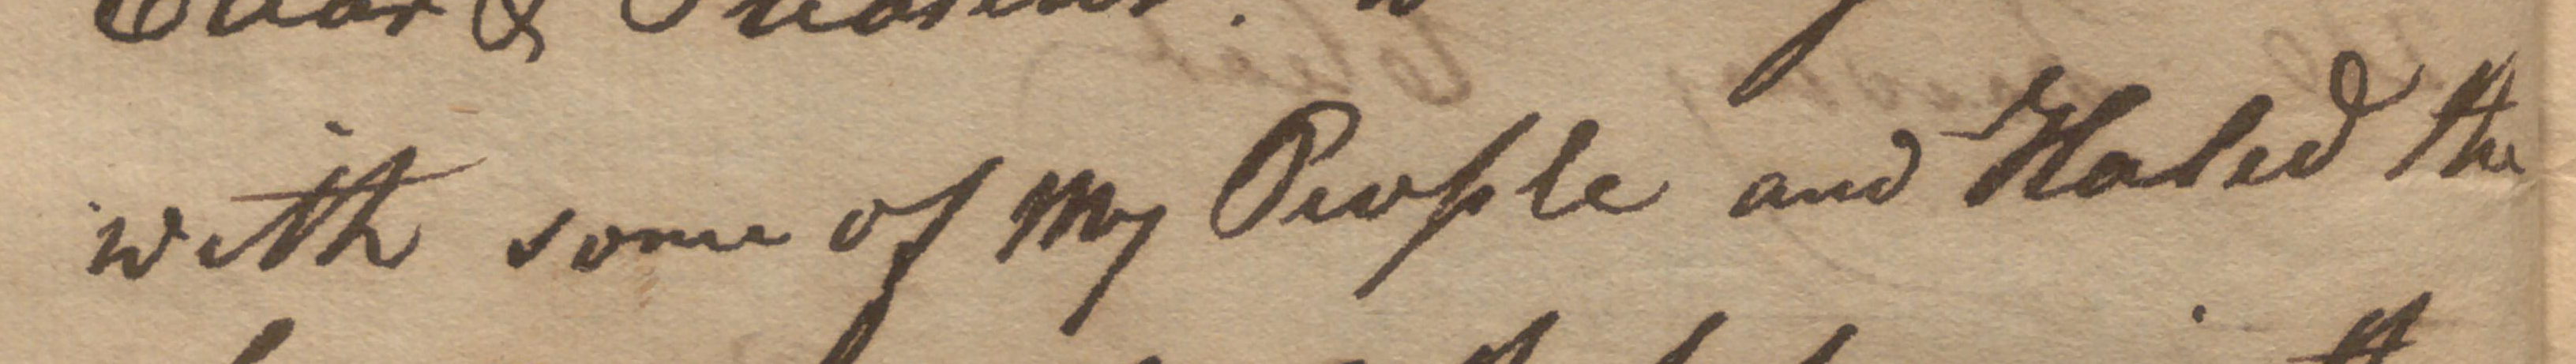with some of my People and Haled the
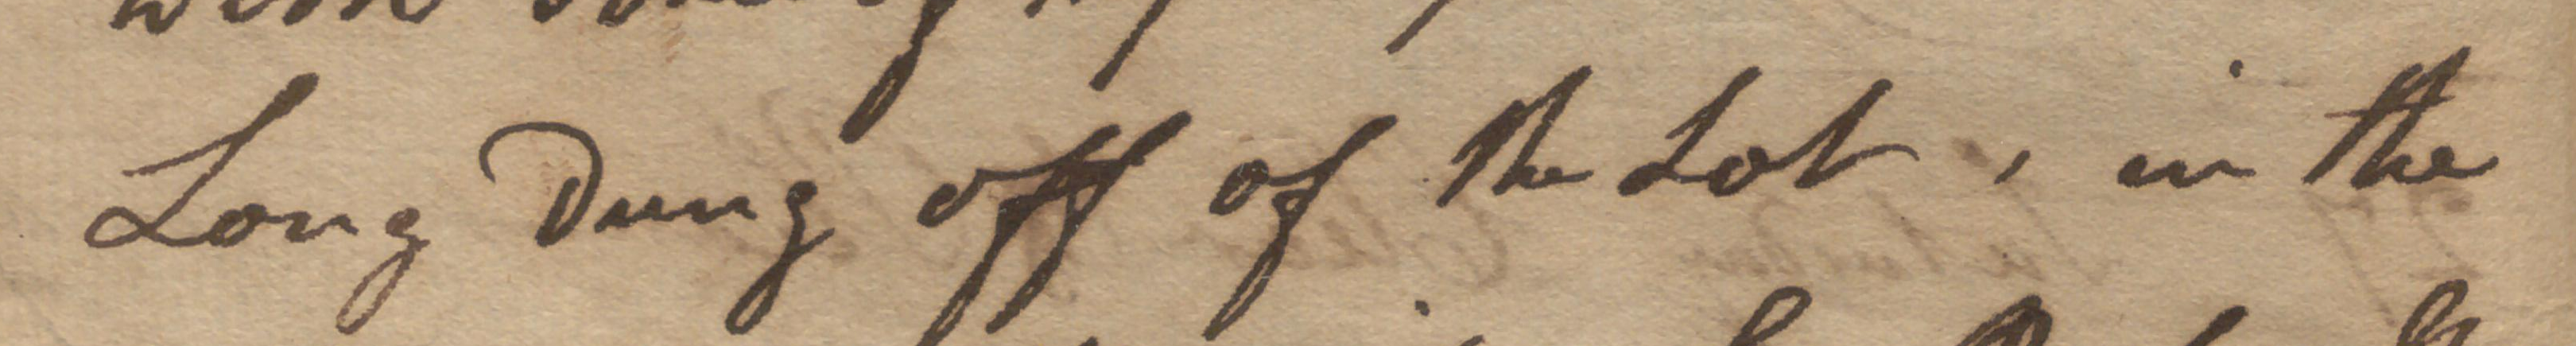Long dung off of the Lot, in the
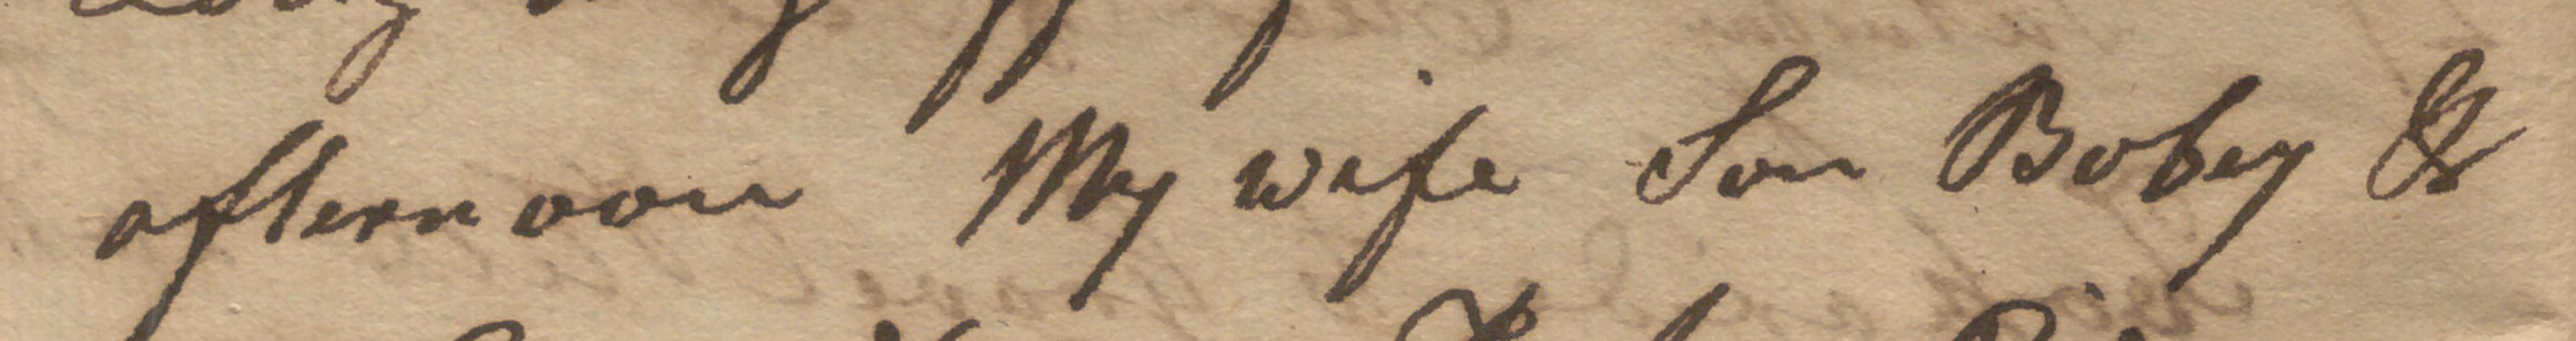afternoon My wife Son Bobey &
